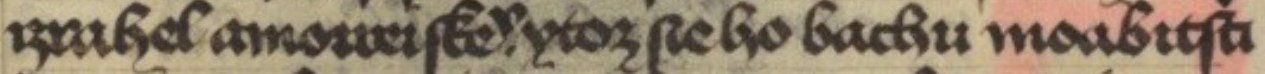izrahel amorreiſke.v ytoz ſie ho bachu moabitẛti
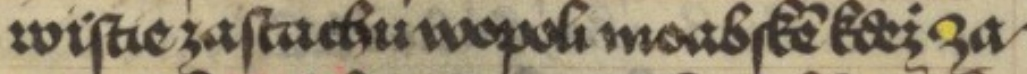wiſtie zaſtachu wopoli moabſkȇ kdeż za
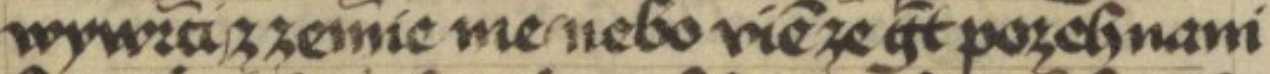wywrci z zemie me nebo viȇ ze g̑t pozehnani
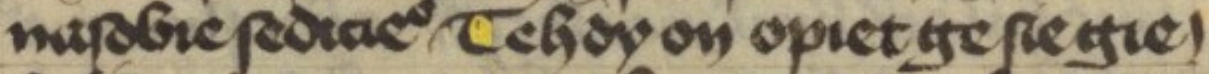naſobie ſedicie° Tehdy on opiet ge ſie gie
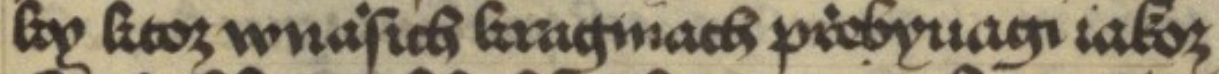ky ktoz wnaẛich kraginach pṙebyuagi iakoz
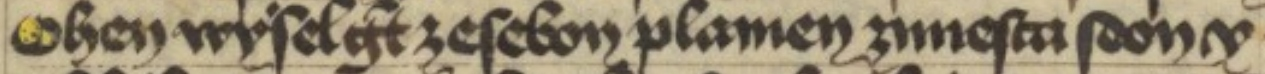Ohen wyẛel g̑t zeſebon plamen zmieſta ſeon y-
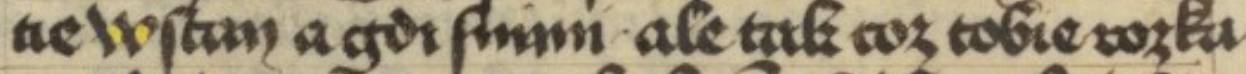tie Wſtan a gdi ſnimi ale tak coz tobie rozka-
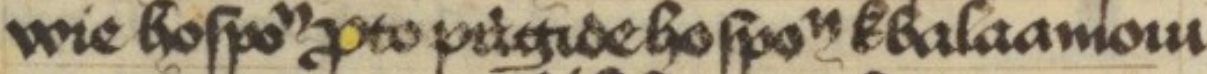wie hoſpon ꝓto prigidehoſpon k balaamoui
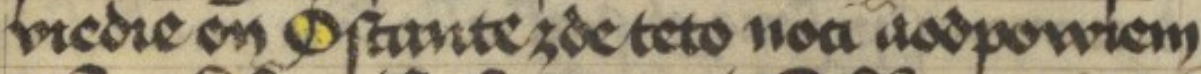viedie on Oſtante zde teto noci aodpowiem
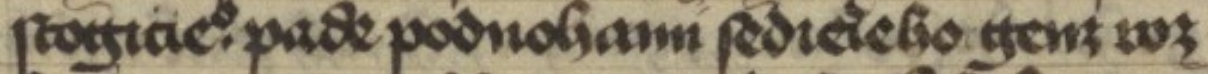ſtogicie.° pade podnohami ſedieíeho genz roz
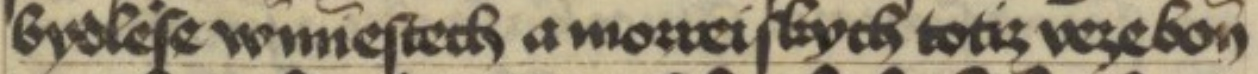bydleẛe wmieſtech a moizeiſkych totiz vezebon
